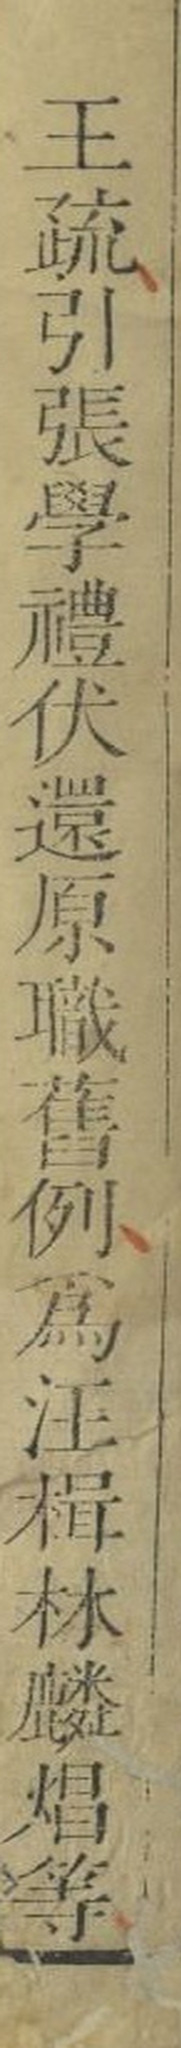王疏引張學禮伏還原職舊例爲汪楫林麟焻等
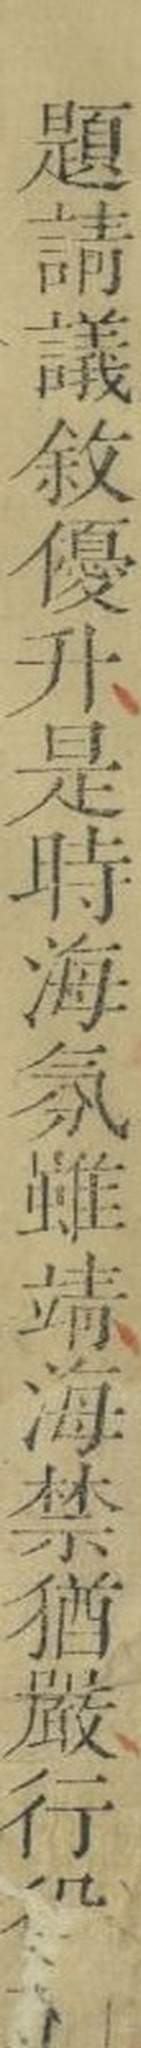題請議敘優升是時海氛雖靖海禁猶嚴行役艱
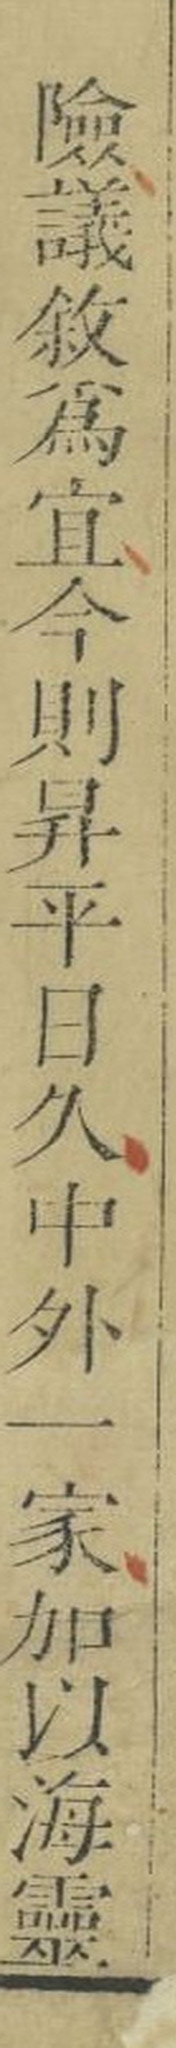險議敘爲宜今則昇平日久中外一家加以海靈
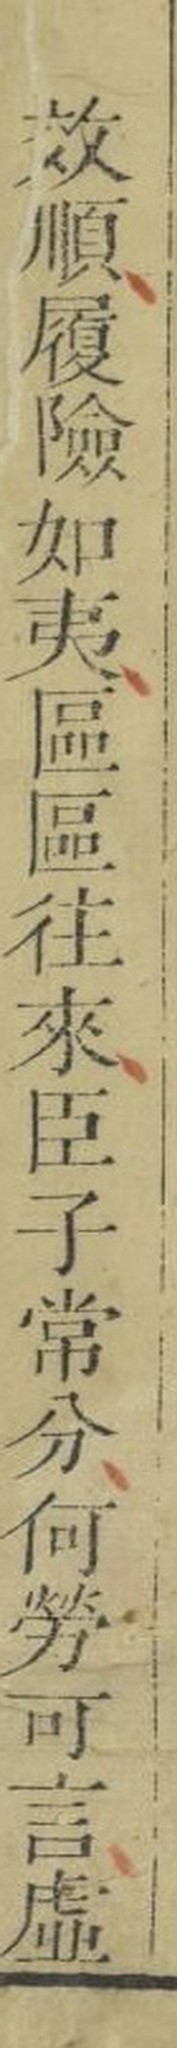效順履險如夷區區往來臣子常分何勞可言虛
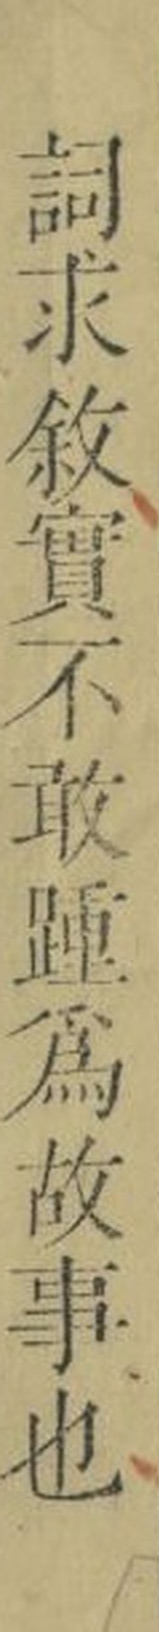詞求敘實不敢踵爲故事也
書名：中山伝信録 巻一、巻二
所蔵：University of the Ryukyus Library
